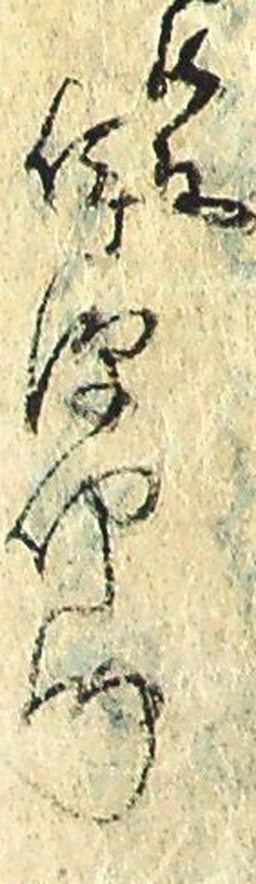伊沢仲助

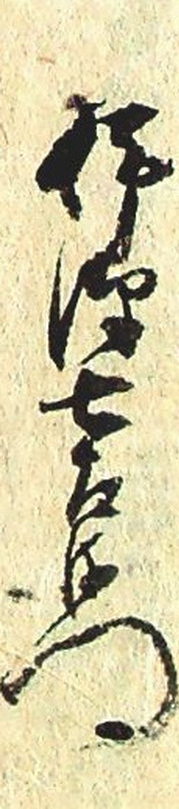伊沢七右衛門
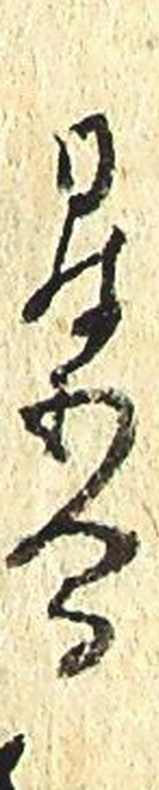同村五人与
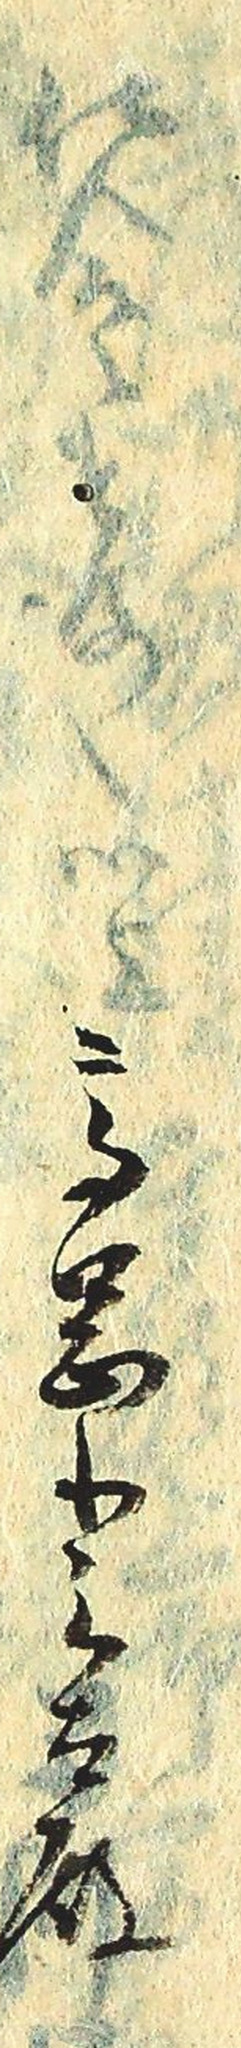高岡小三太殿
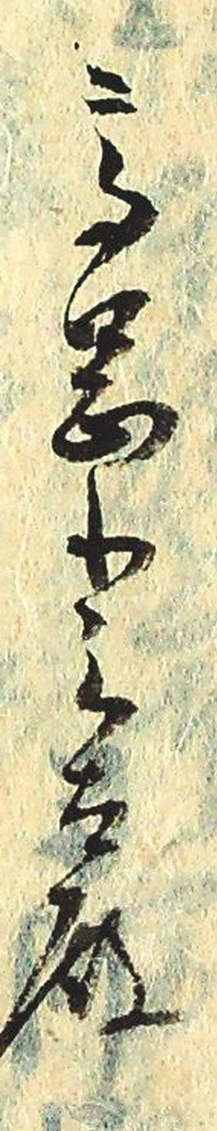高岡小三太殿
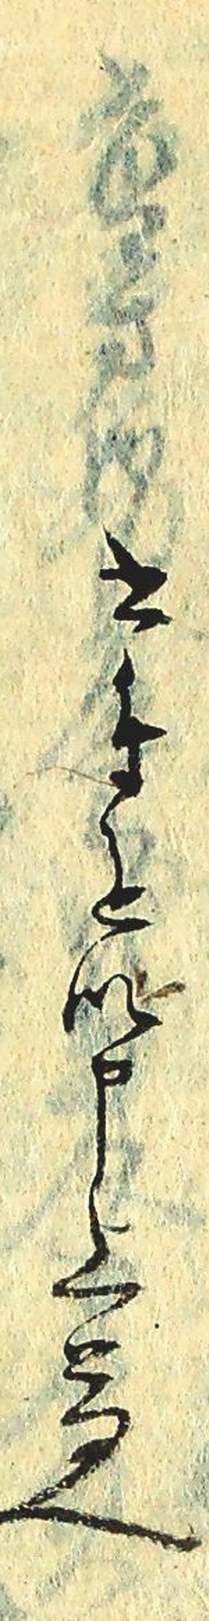書付を以申上覚
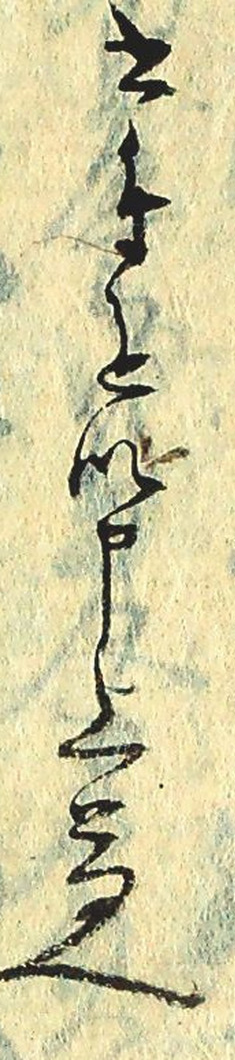書付を以申上覚
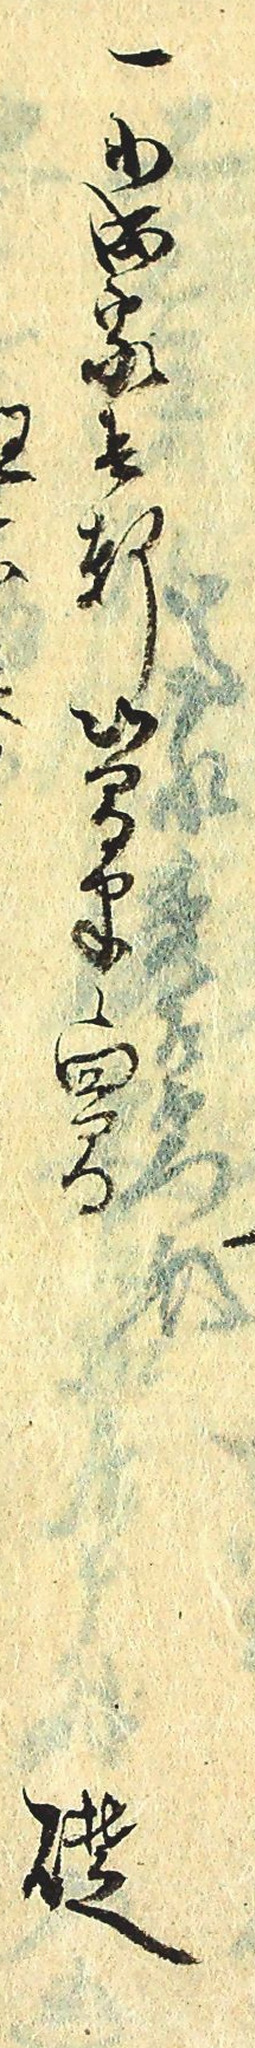一小成家壱軒弐間半に四間
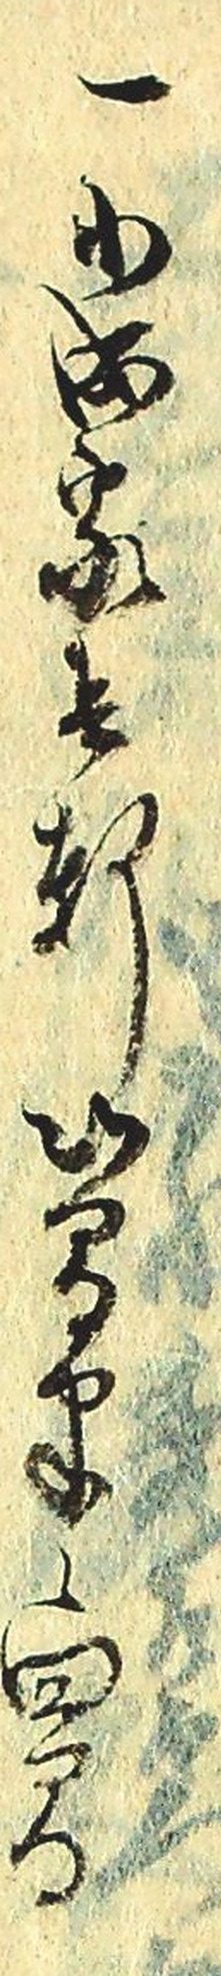一小成家壱軒弐間半に四間
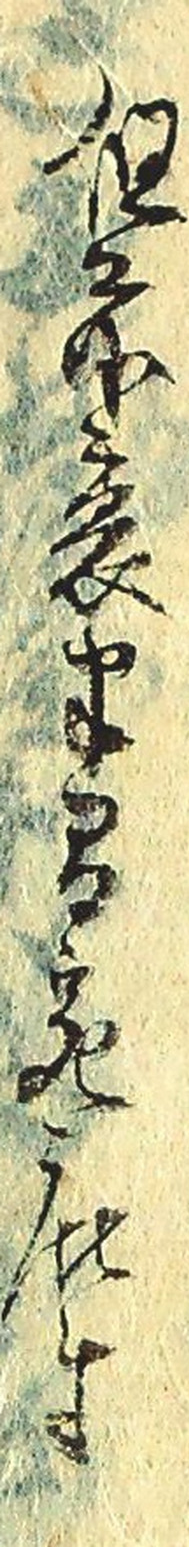但前裏半間宛庇付
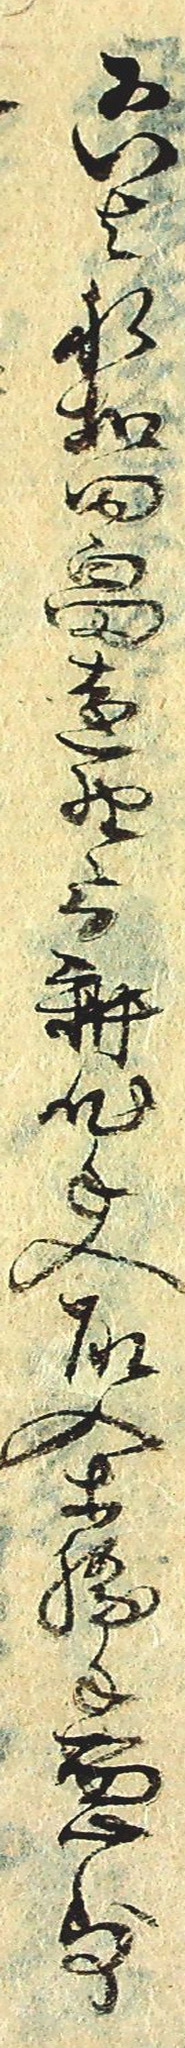右は私扣田畠遠野にて耕作手入取入等勝手悪布
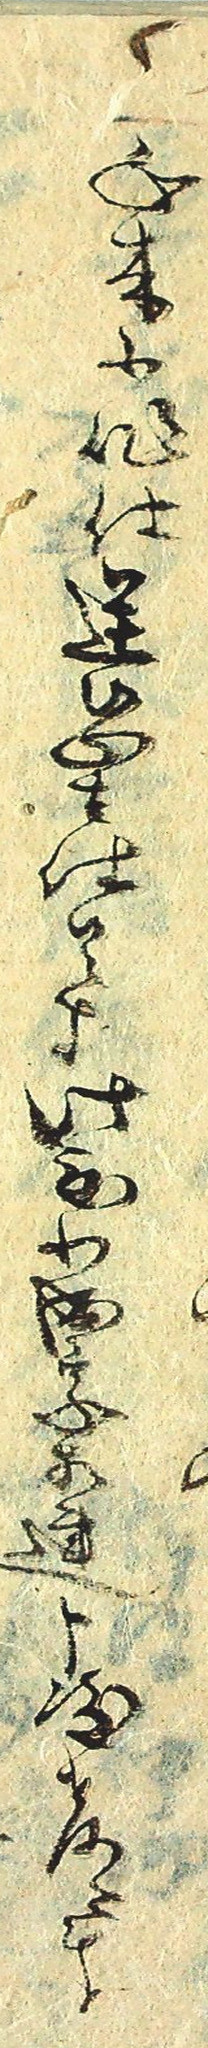年来不作仕迷惑奉仕候に付此度小成家相建申度奉存に付
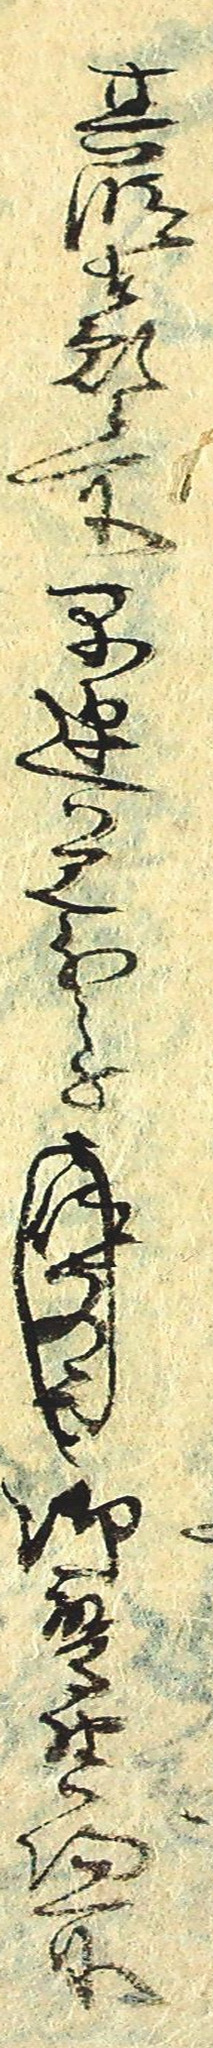其段奉願候所早速御見分之上「被仰聞候は」御鷹野御場所
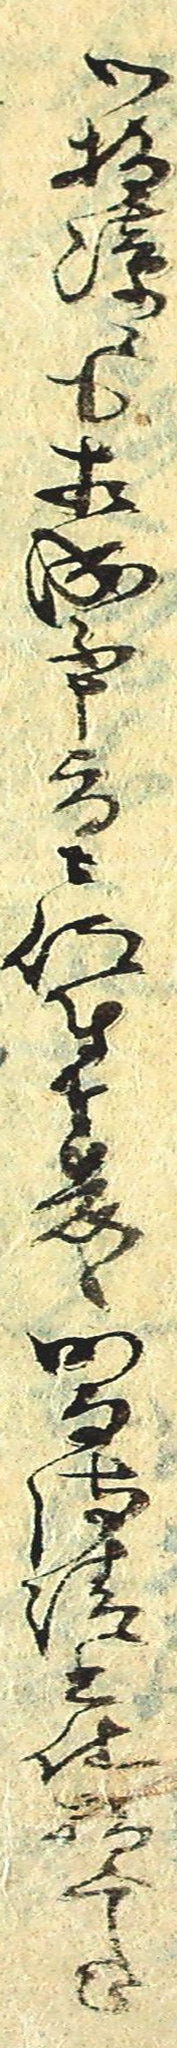御指障にも相成不申旨被仰付奉畏候仍て御請書仕指上候以上
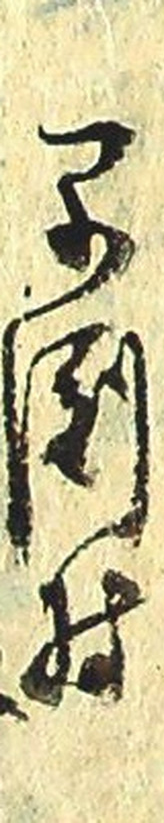早淵村
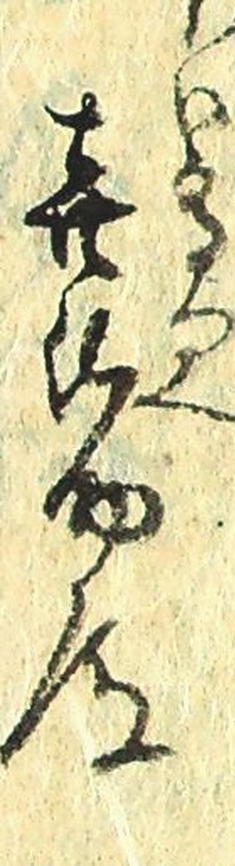喜代助殿
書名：諸御願書控(弐番）
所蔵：鳴門教育大学 Naruto University of Education
